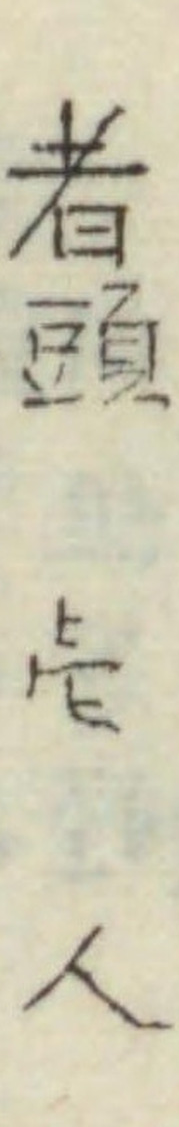備頭壱人
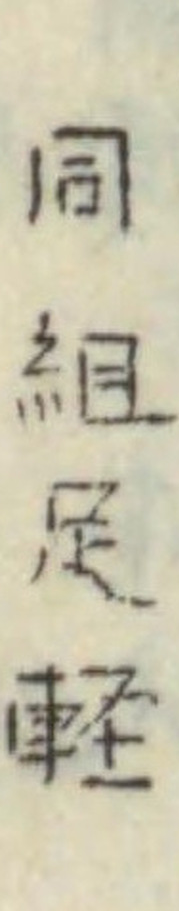同組足軽
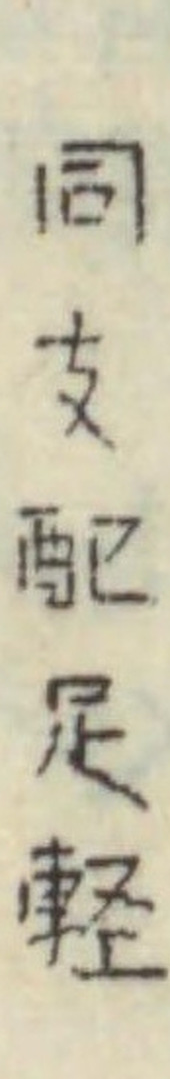同支配足軽
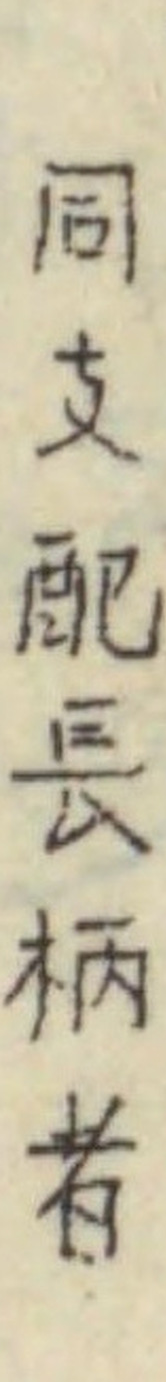同支配長柄者

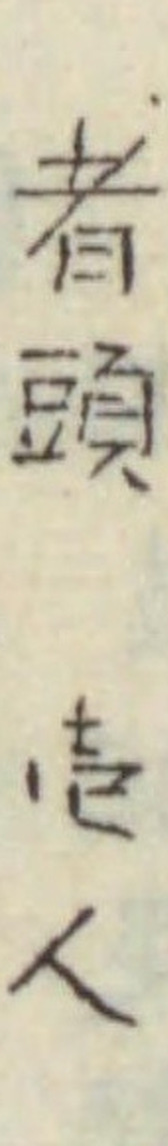備頭壱人
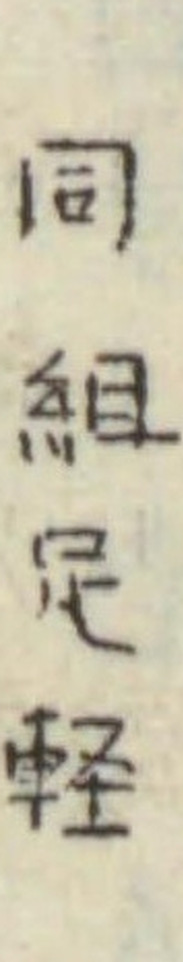同組足軽
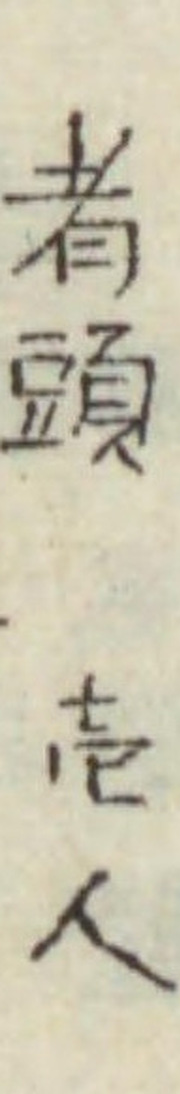鉄砲者頭壱人
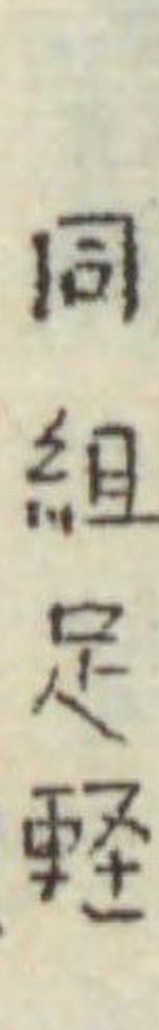同組足軽
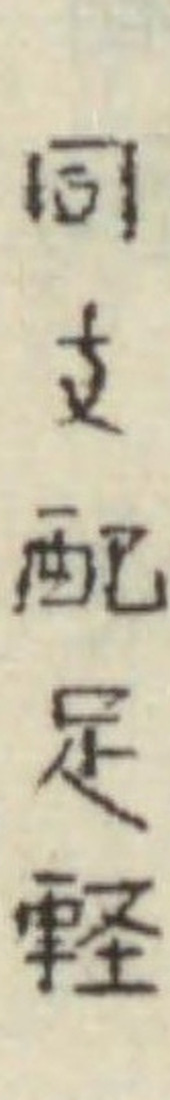同支配足軽
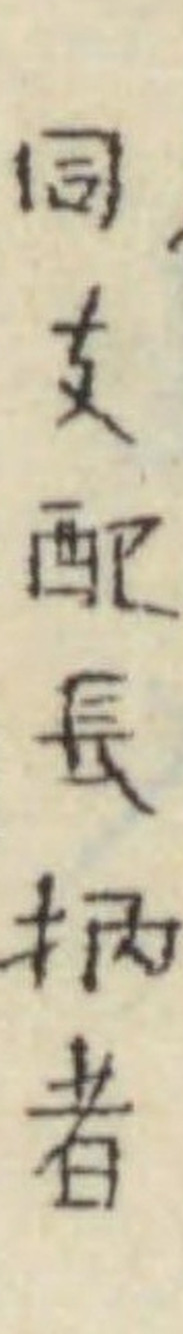同支配長柄者
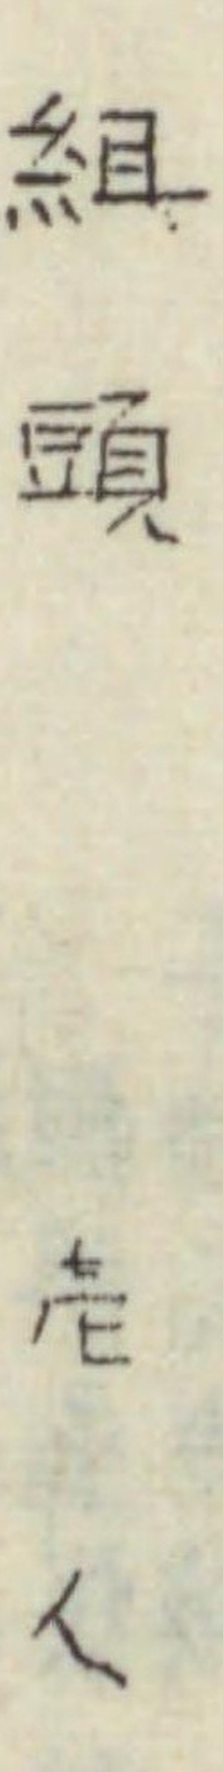組頭壱人
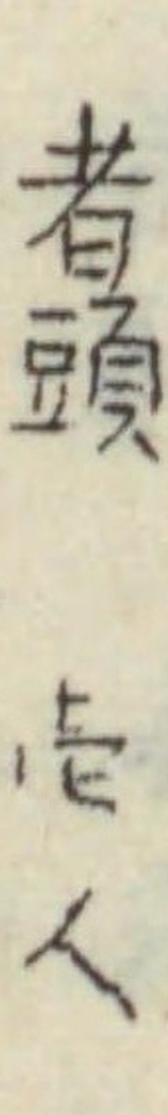備頭壱人
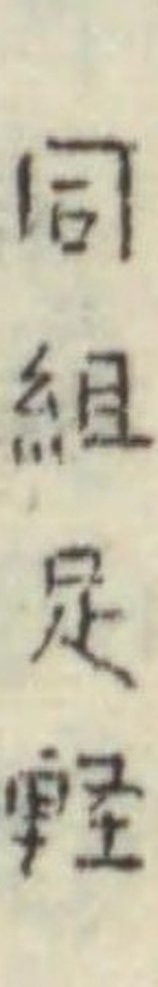同組足軽
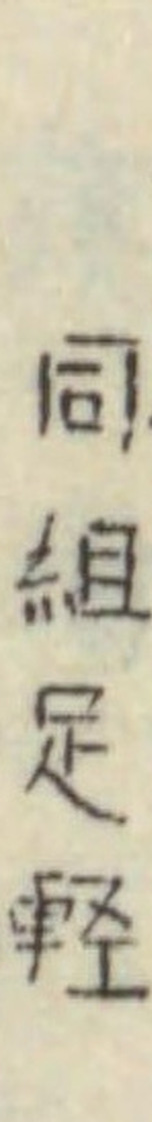同組足軽
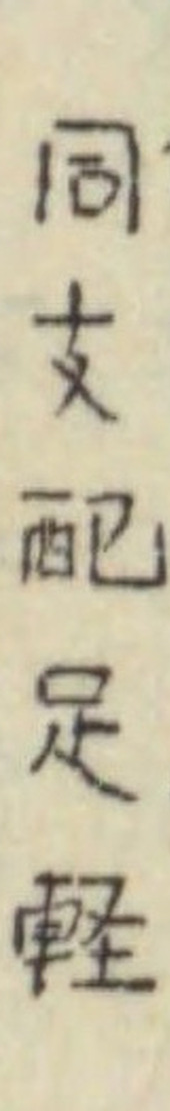同支配足軽
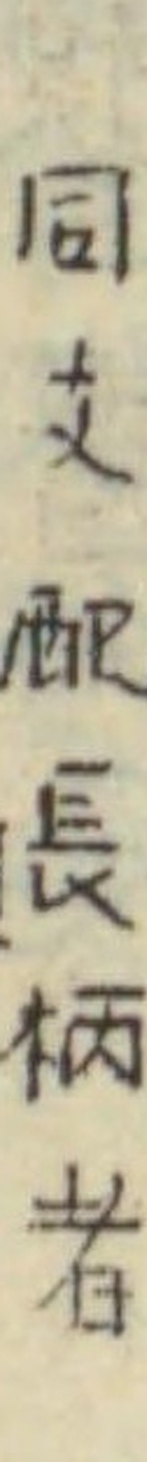同支配長柄者
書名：三河吉田藩動員史料
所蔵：国立国会図書館 National Diet Library, JAPAN
